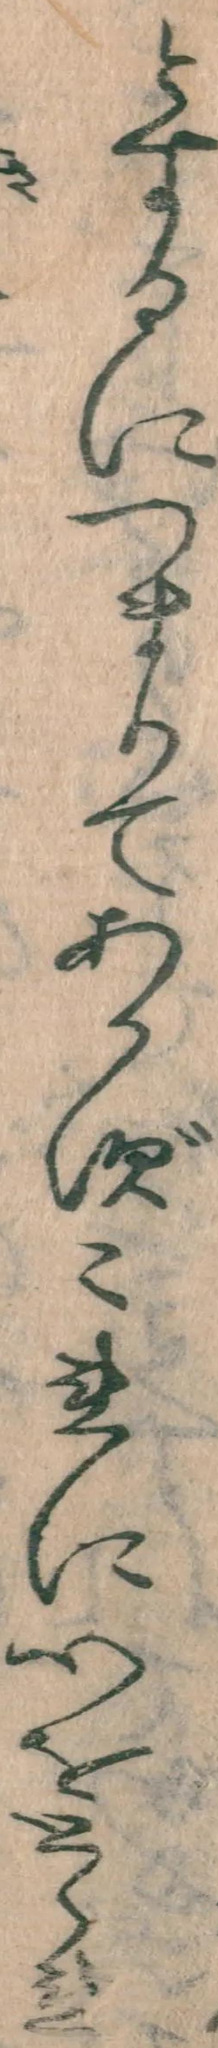とするにつまりてあかずこれに心をとられ
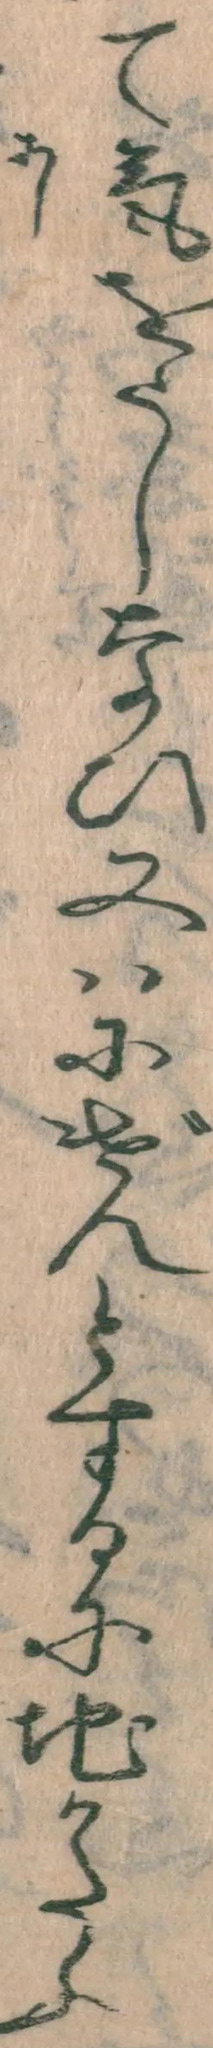て気をうしなひ又はにげんとするに地かたふ
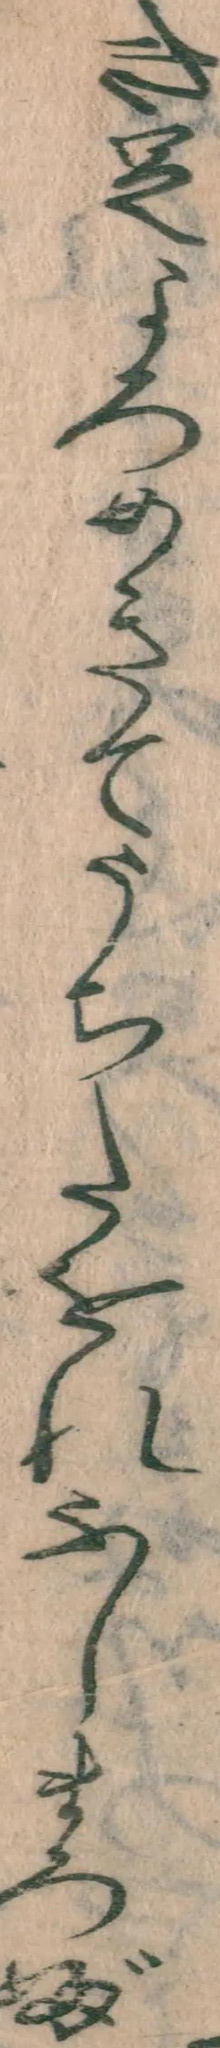き足よろめきてうちたをれふしまろぶ
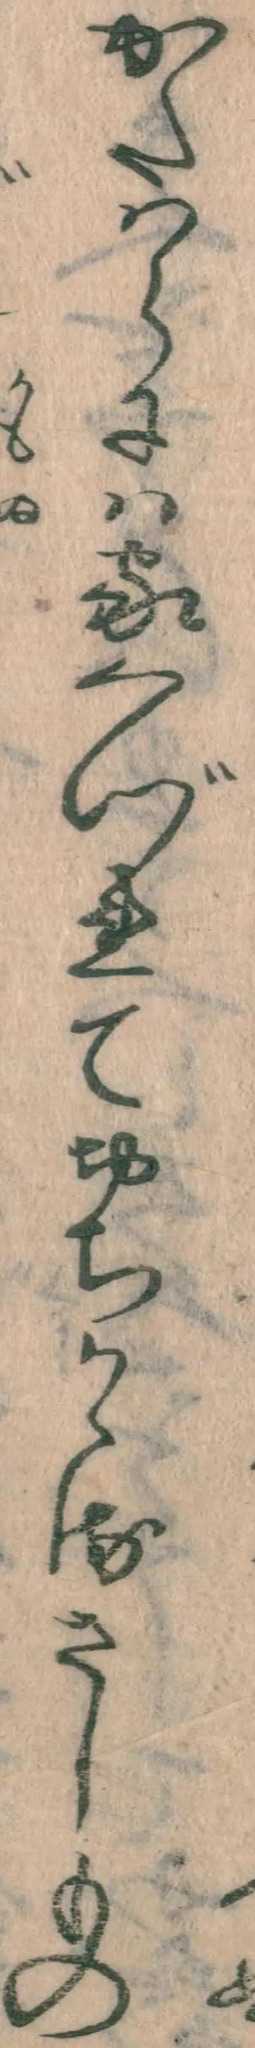かたはらには家くづれておちかゝるさしもの
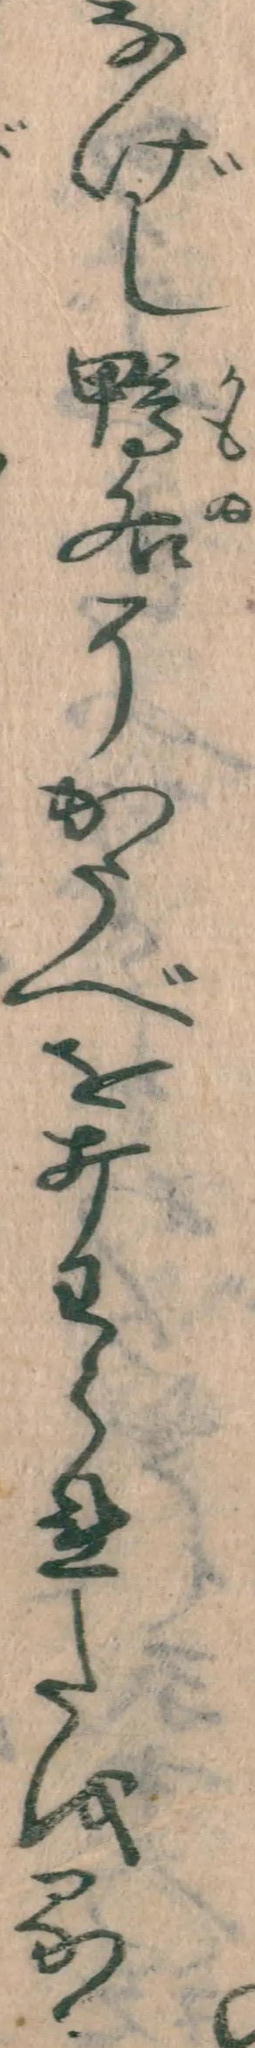なげし鴨居にかうべを打わられたをるゝ
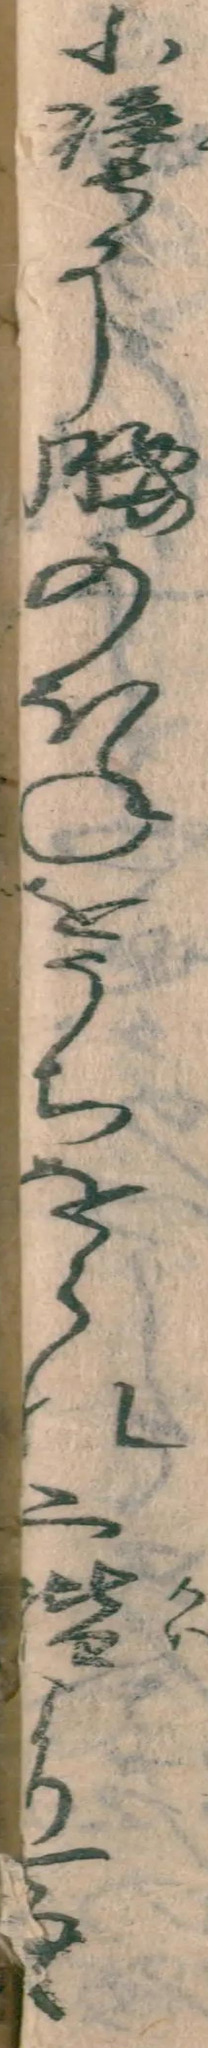小壁に腰のほねをうちをられ二階より高
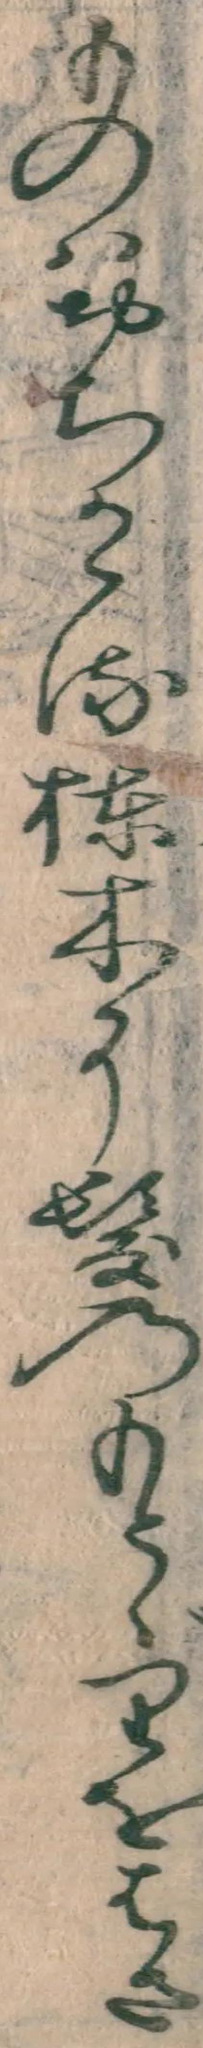ものはおちかゝる棟木に髪のもとゞりをはさ
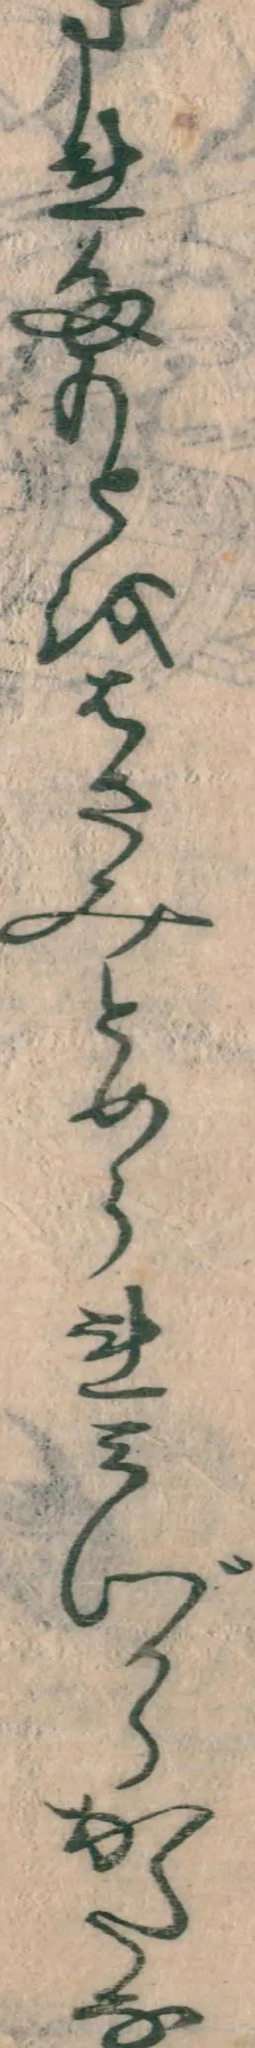まれたもとをはさみとめられみづからかたな
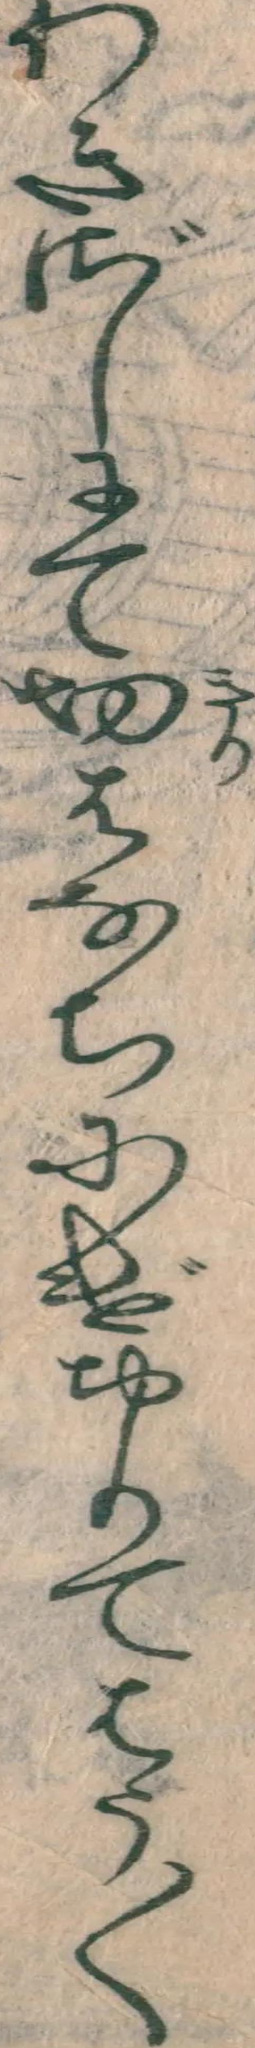わきざしにて切はなちにげおりてはう〳〵
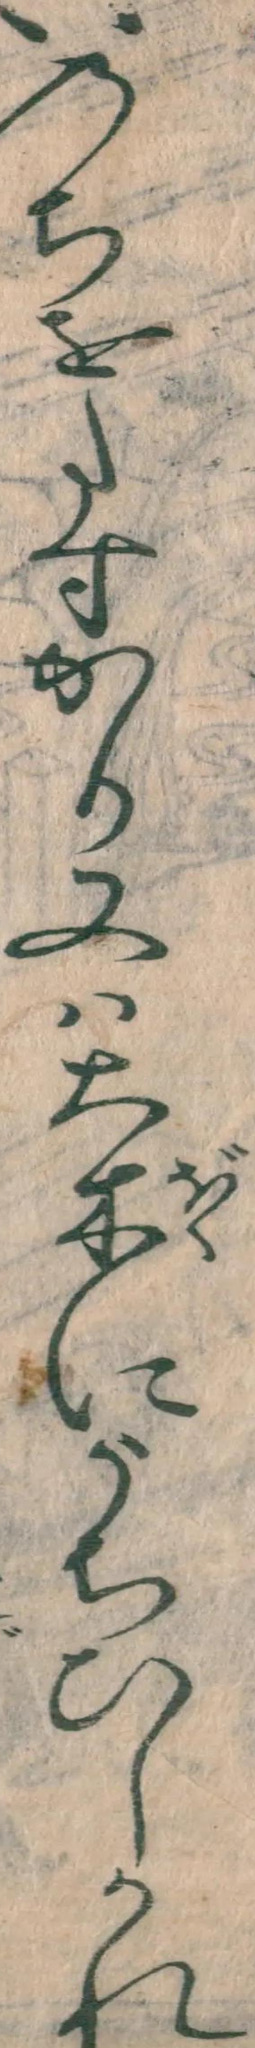いのちをたすかり又は大木にうちひしかれ
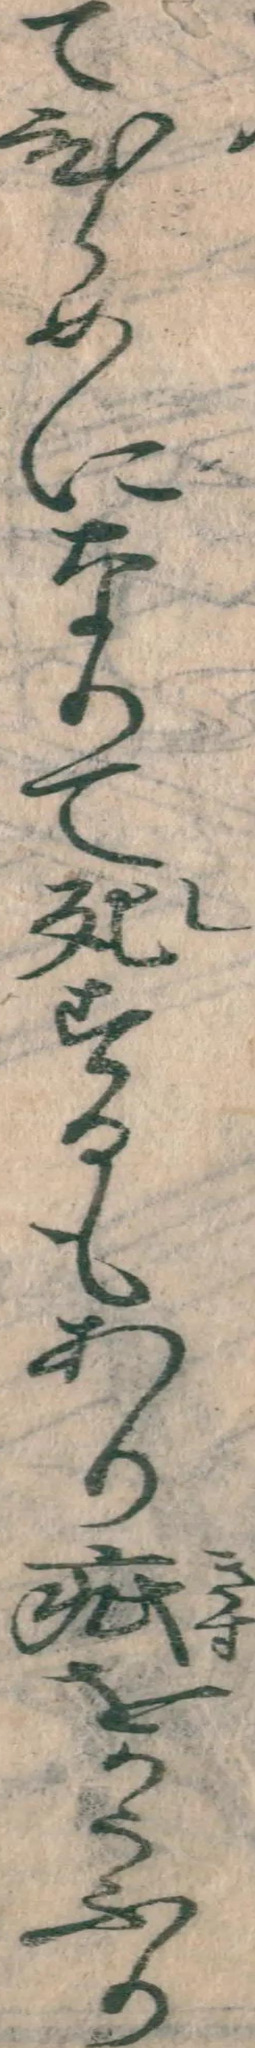てひらめになりて死するもあり疵をかうふり
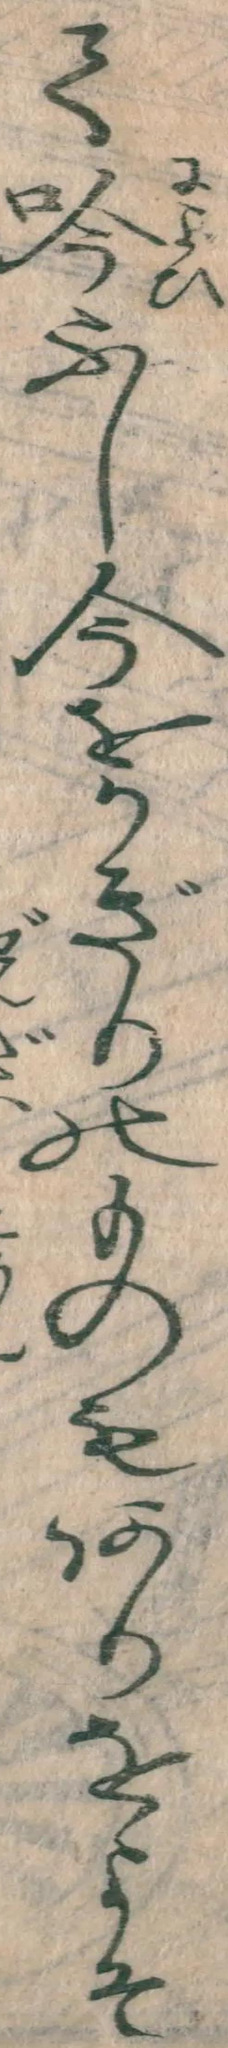て吟ふし今をかぎりのものもありをよそ
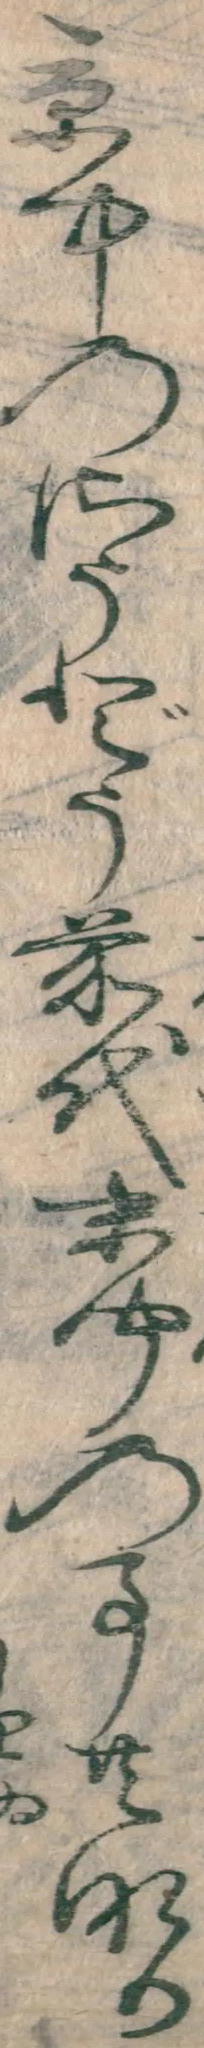京中のさうどう前代未聞の事共なり
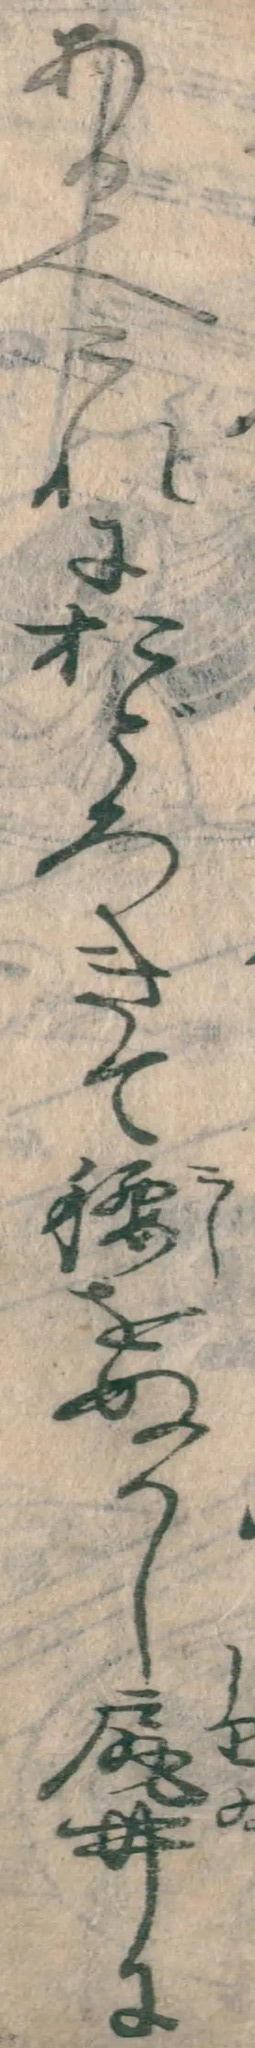ある人これにおどろきて腰をぬかして尻井に
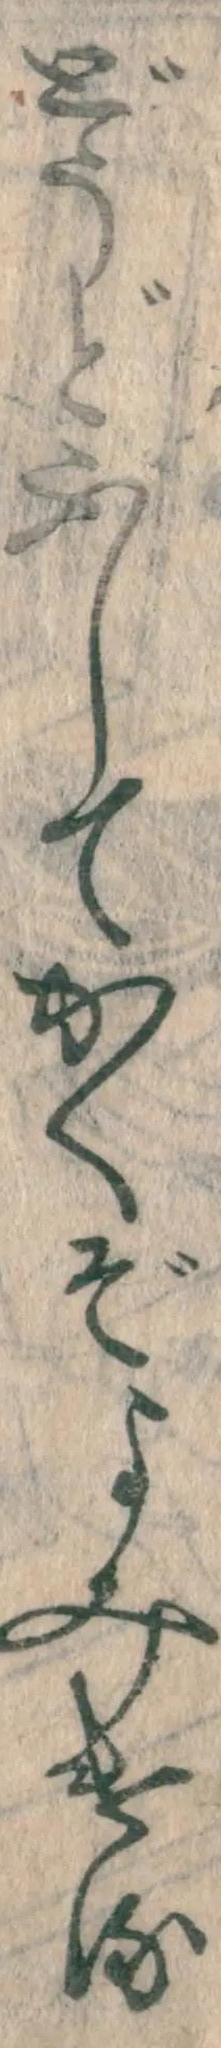どうどふしてかくぞよみける
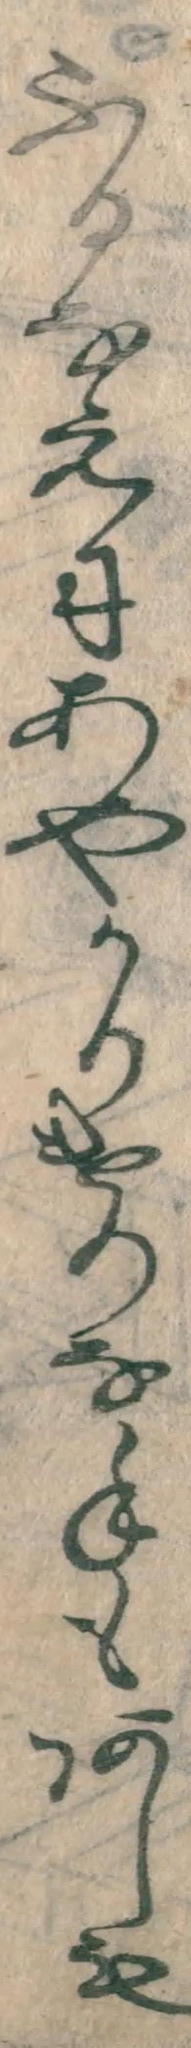ふるなえにあやかりけりな手も足も
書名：艱難目異志. 上,下
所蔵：国立国会図書館 National Diet Library, JAPAN
